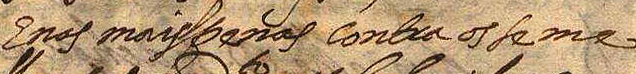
E nas mais penas contra os seme
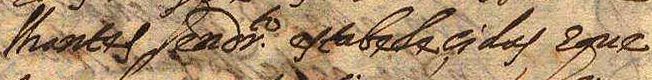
lhantes en dr.to estabeleçidas E que
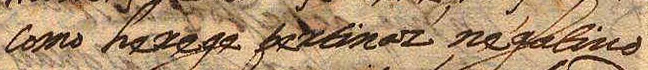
como herege pertinaz negatiuo
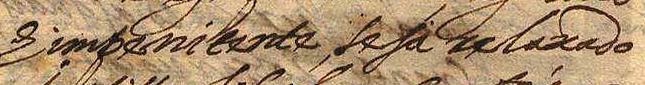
E impenitente, seja relaxado
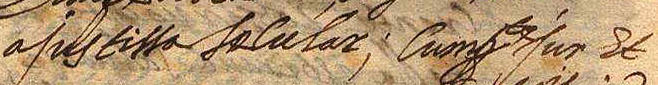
a justissa secular; cum ꝓte jur Et
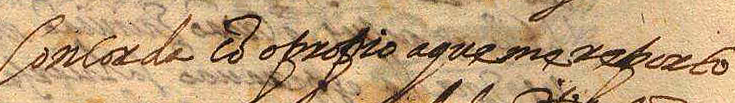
Concorda cō o propio a que me reporto
